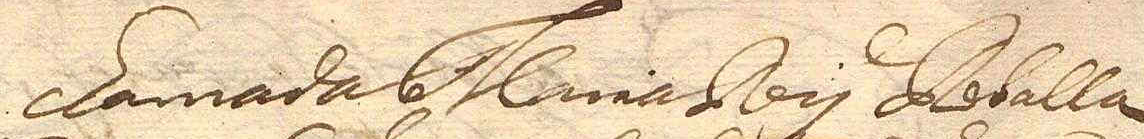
chamada Maria Rois̄ Roballa
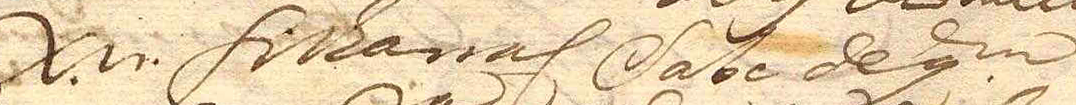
x. n. filha naõ Sabe de q.m
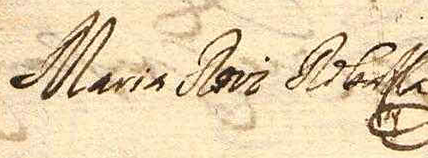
Maria Roiz Roballa
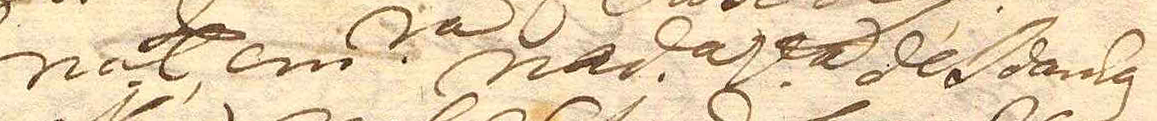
nal, e m.ra na d.a V.a de Idanha
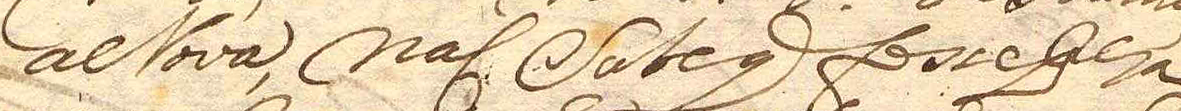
a Nova, naꝭ Sabe q̄ fosse pReza
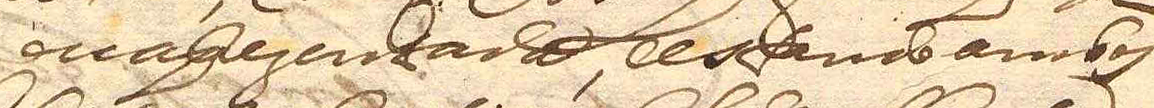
ou apRezentada, e estando ambos
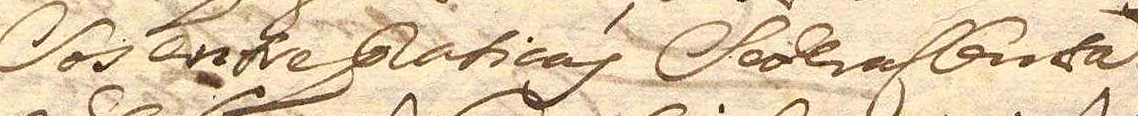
Sos entre pRaticas Se deraꝭ Conta
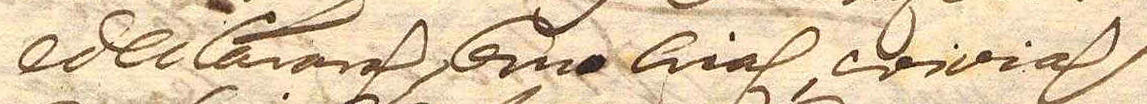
e declararaꝭ Como criaꝭ, e viviaõ
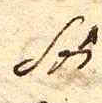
Sós
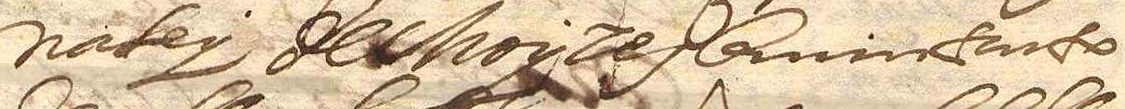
na ley de Moyzes Com intento
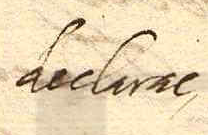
declaraç
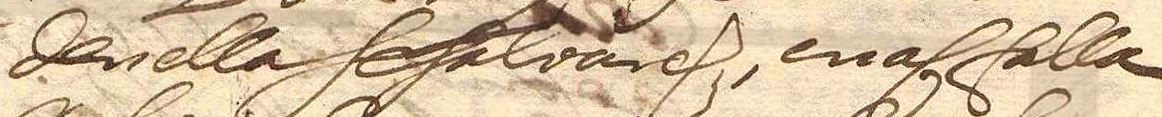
de nella se salvareꝭ, e naꝭ falla
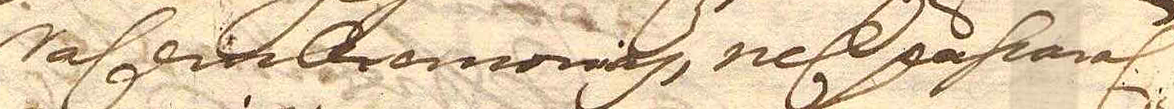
raꝭ em ceremonias, neꝭ passaraꝭ
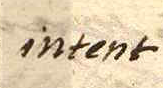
intent
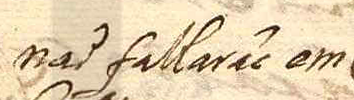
naõ fallarão em
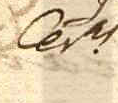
Cer.as
